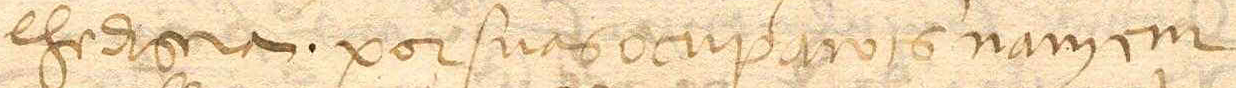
lhe disera. por suas ocupacões nam em
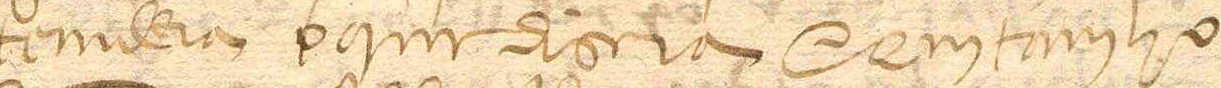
temdera o que disera e emtam ho
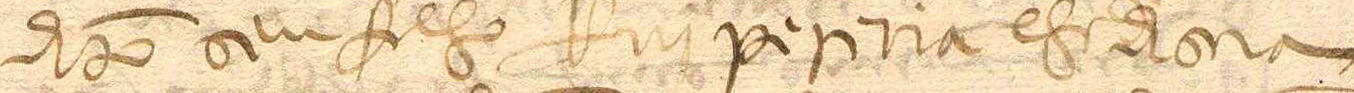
dit̄o seu filho Ruj pereira lhe disera
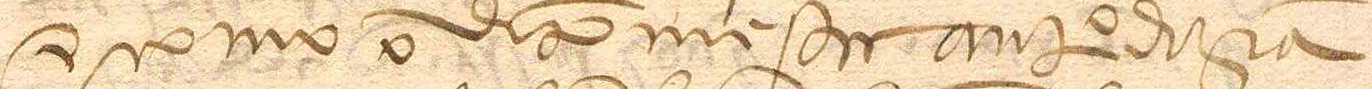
ē como o dit̄o mestre anto dizia
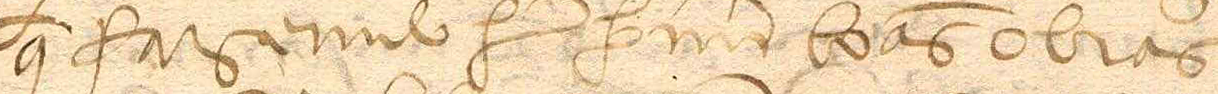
q̄ fazendo hū homē boās obras
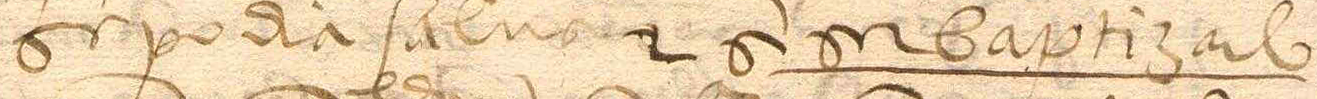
se podia saluar sē ser baptizado
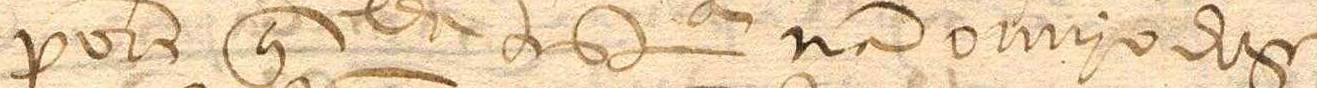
porē q̄ ella testa nā ouujo dizer
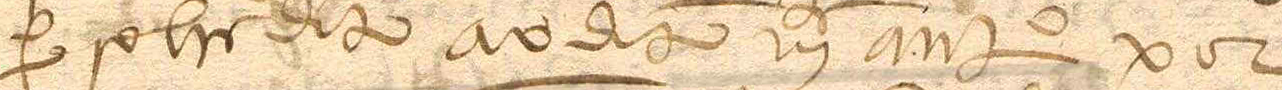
ho sobredit̄o ao dit̄o mte anto por
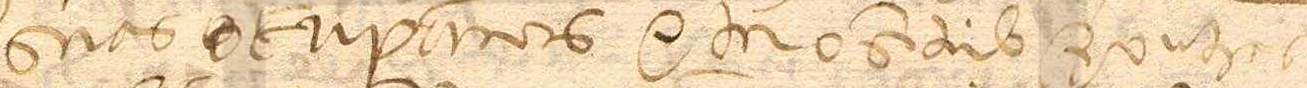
suas ocupacões e ter o sētido ē outras
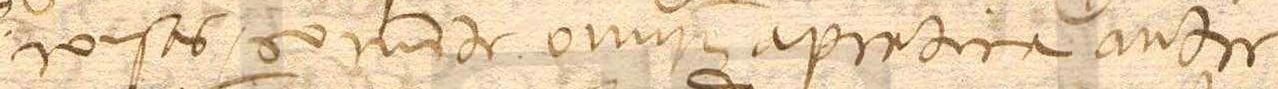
cousas / somēte ouujr a pratica antre
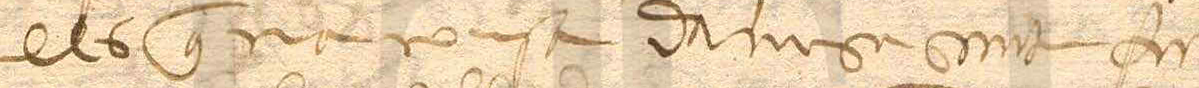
elles q̄ era cousa da nosa samta fee
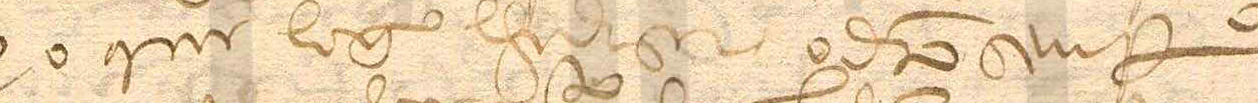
e o que logo lhe disera o dt̄o seu fo
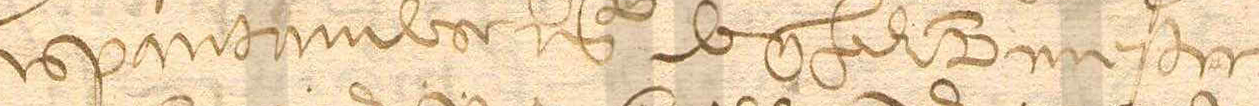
espantamdose mto do q̄ ho dt̄o mestre
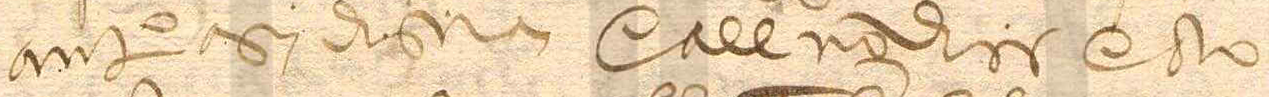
anto asy disera e all nō dise e Ao
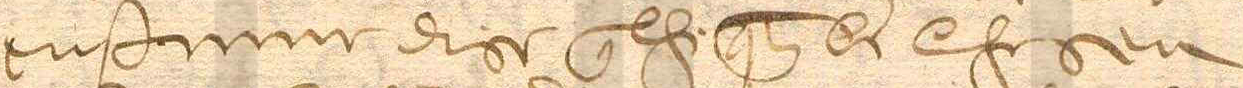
custume dise q̄ lhe q̄r bē e he seu
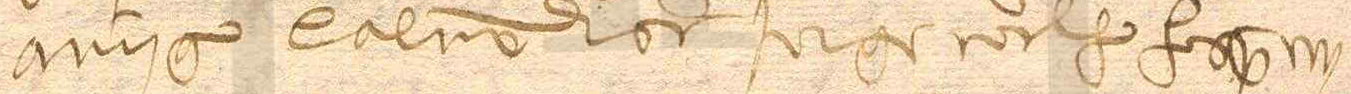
amjgo e al n̄o dise Jorge coelho ho sp̄evy
